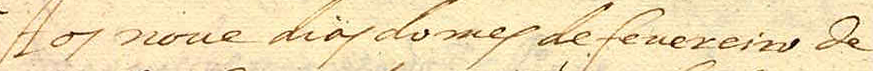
Aos noue dias do mes de feuereiro de
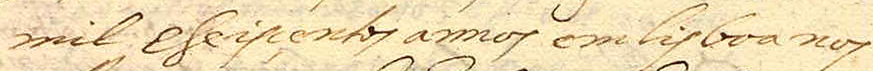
mil E seisçentos annos em lisboa nos
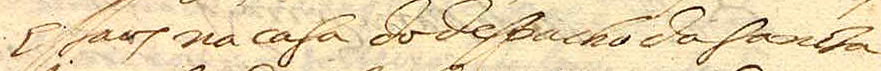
Estaos na casa do despacho da sancta
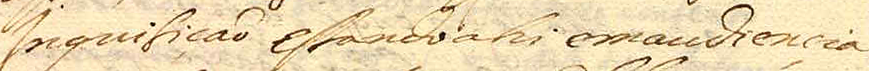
Jnquisiçaõ estando ahi em audiençia
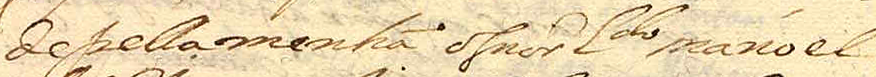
de pella menhã o snor̄ Ldo manoel
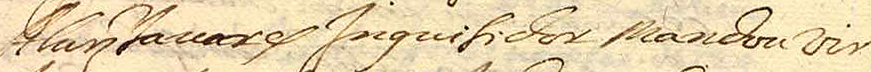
Alurz̄ tavares Jnquisidor mandou vir
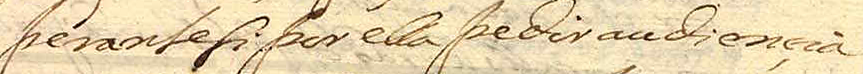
perante si por ella pedir audiençia
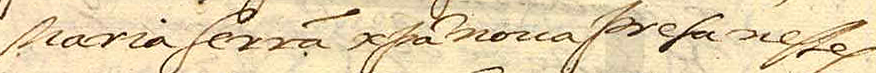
Maria Serrã xpã noua presa nestes
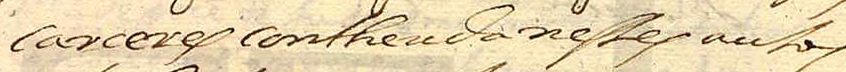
carçeres contheuda nestes autos
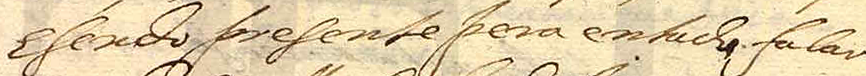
e sendo presente pera en tudo falar
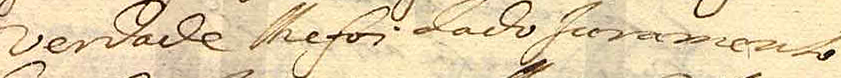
verdade lhe foi dado Juramento
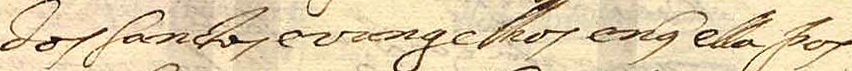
dos sanctos evangelhos en q̄ ella pos
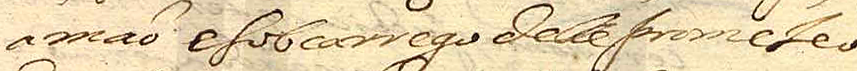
a maõ e sob carrego delle prometeo
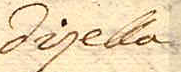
dizella
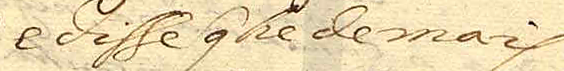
e disse q̄ he de mais
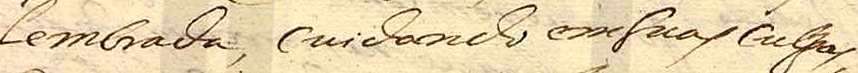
lembrada, cuidando em suas culpas,
